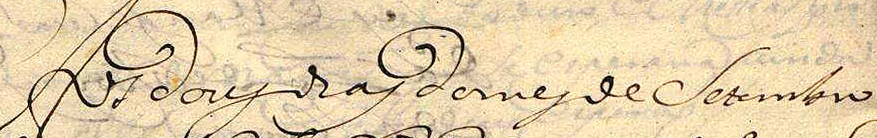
Aos dous dias do mes de Setembro
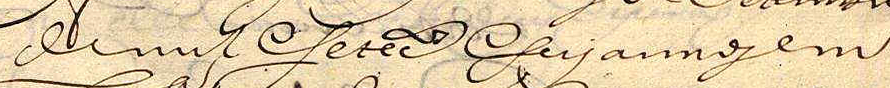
de mil e setectos E seis annos em
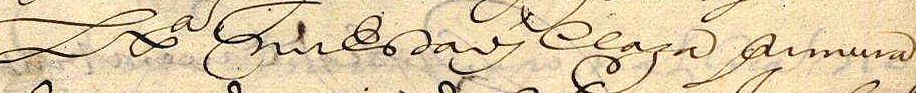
Lxa nos Estaós e caza primeira
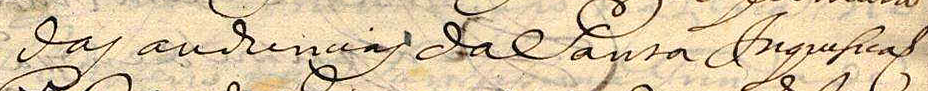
das audiencias da Santa Inquisiçaꝭ
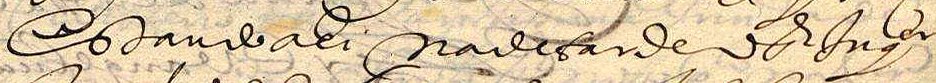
Estando ahi na de tarde o sor Inqor
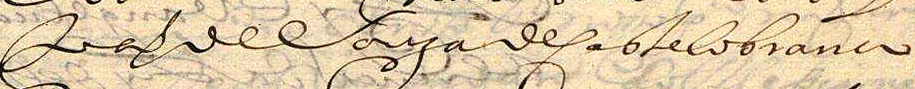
Ioaꝭ de Souza de Castelobranco
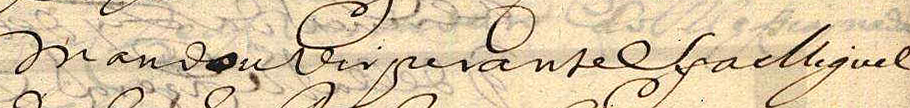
mandou vir perante Sy a Miguel
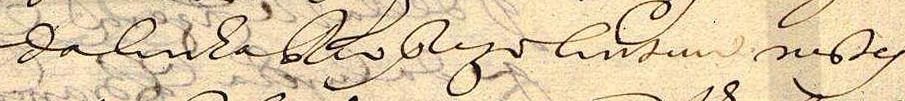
da Cunha Reo pRezo conteudo nestes
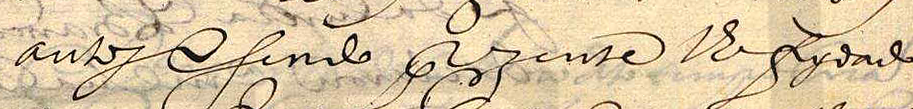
autos E sendo prezente lhe foy dado
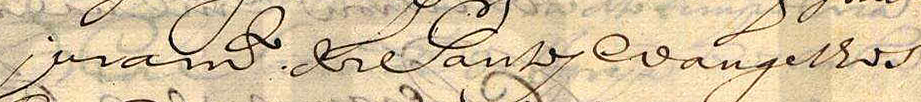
juramto dos Santos evangelhos
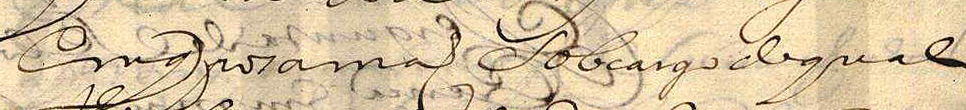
Em q̄ pos a maõ Sob cargo do qual
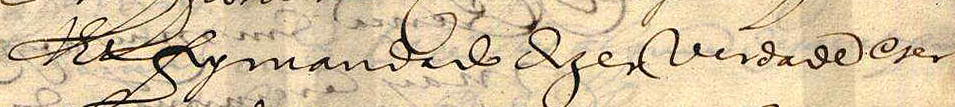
lhe foy mandado dizer verdade e ter
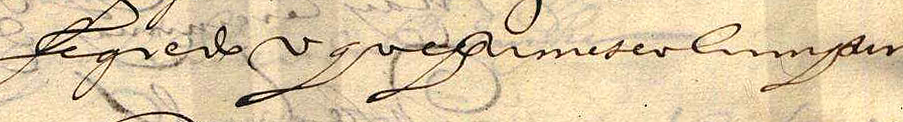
segredo o que prometeo cumprir
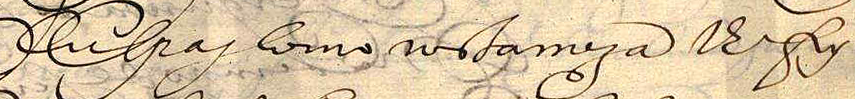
Culpas como nesta meza lhe foy
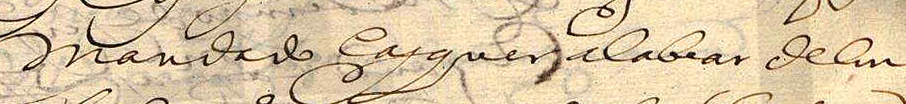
mandado E as quer acabar de con
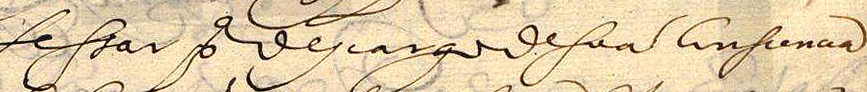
fessar pa descargo de sua consiencia
